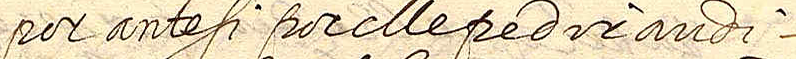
perante si por elle pedir audi
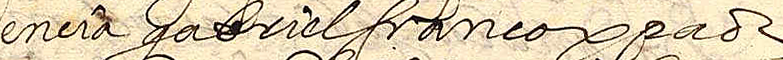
encia gabriel franco xpaõ
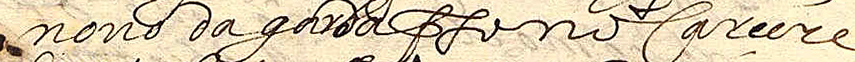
nouo da garda p̄so no Carçere
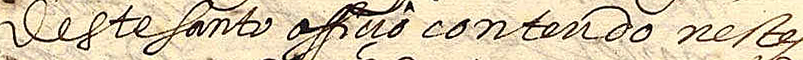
deste santo offiçio conteudo nestes
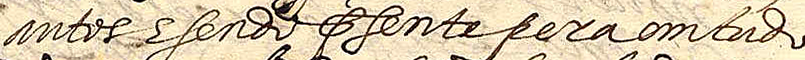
autos E sendo p̄sente pera em tudo
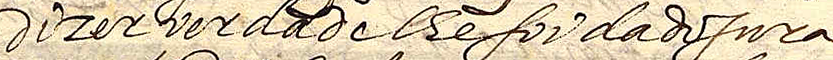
dizer verdade lhe foi dado Jura
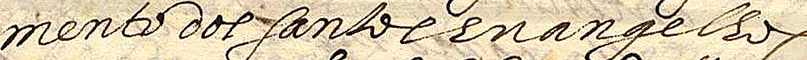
mento dos santos Euangelhos
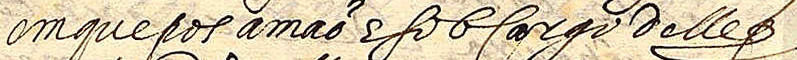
em que pos a maõ E sob Cargo delle ꝓ
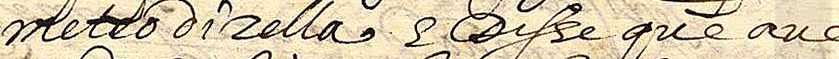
meteo dizella E Disse que aue
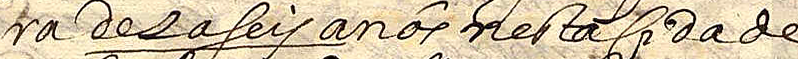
ra dezaseis anōs nesta Cidade
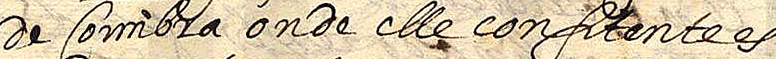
de Coimbra onde elle confitente es
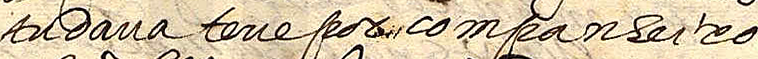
tudaua teue por companheiro
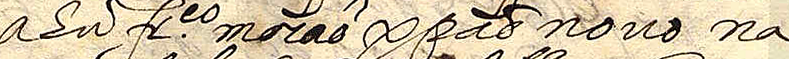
a hū fr.co moraõ xpaõ nouo na
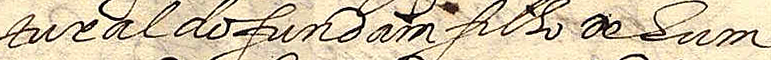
tural do fundam filho de hum
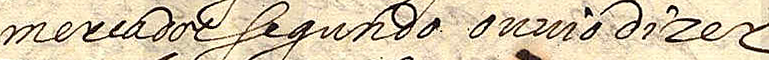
mercador segundo ouuio dizer
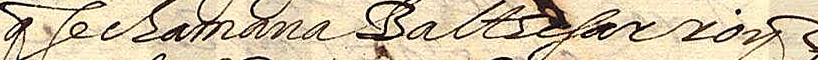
q̄ se chamaua Balthesar roiz̄
